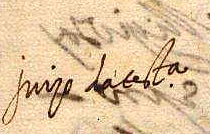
juizo da test.a
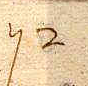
2
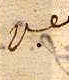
V.e
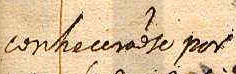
conheceraõse por
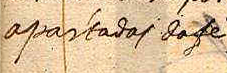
apartadas da fe.
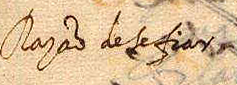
Razaõ de se fiar
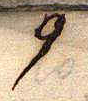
9
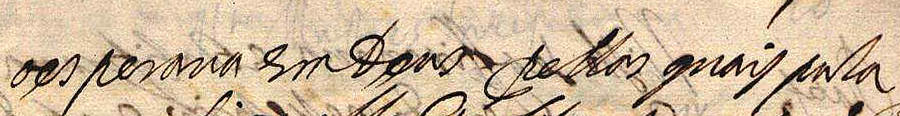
o esperaua Em Deus pellas quais pala
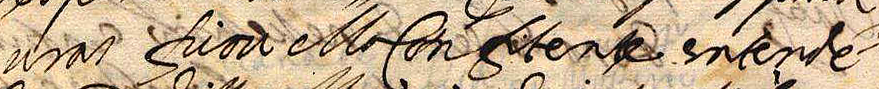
uras ficou ella Confitente entendē
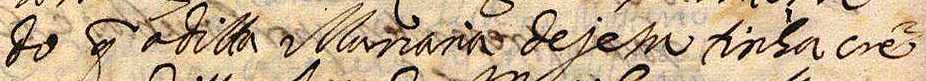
do q̄ a ditta Mariana de jesu tinha crē
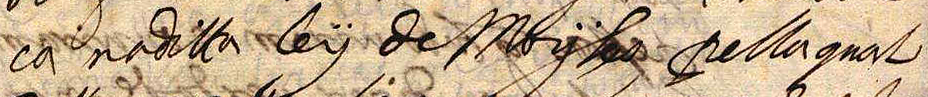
ça na ditta ley de Moyses, pella qual
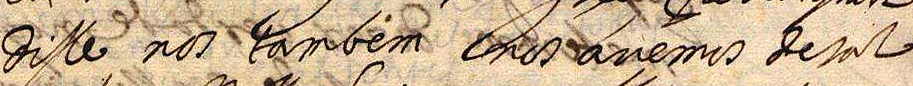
disse, nos tambem nos auemos de sal
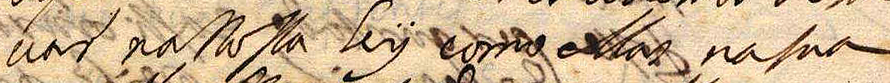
uar na Nossa ley como ellas na sua
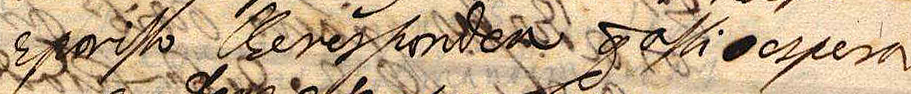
E por isso lhe respondeu q̄ assi o espera
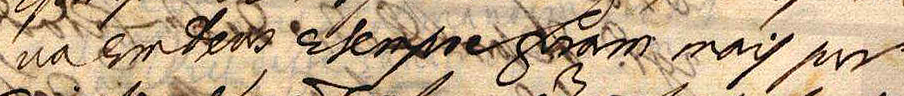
ua Em Deus, E sempre foram mais por
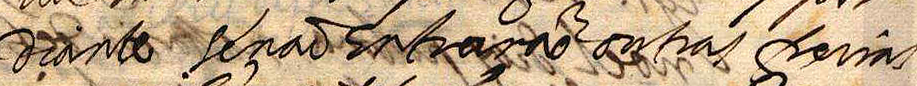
diante se naõ Entraraõ outras freiras
